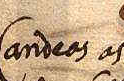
Candeas as
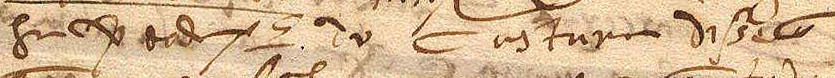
he ꝟdade / E do Custume disse q̄
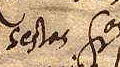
sestas fras
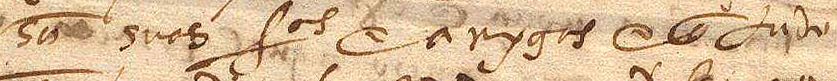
sā suas fas e amygas e q̄ tudo
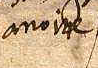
a noite /
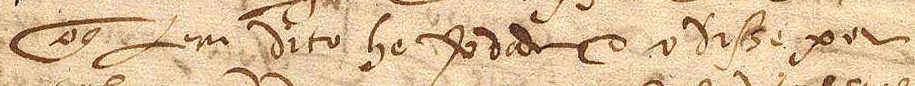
o q̄ tem dito he ꝟdade e o disse por
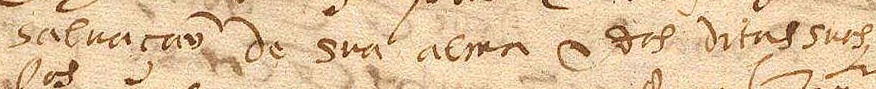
saluação de sua alma e das ditas suas
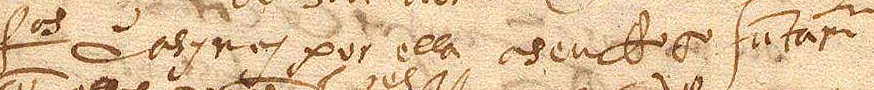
fas e asyney por ella a seu Rogo Jūtamte
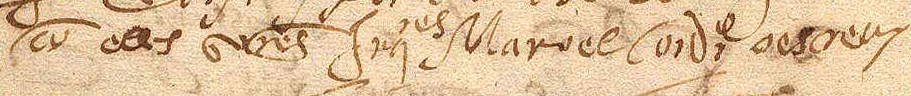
cō elles sor̄es Jnqres Manoel Cordro o escreuj
